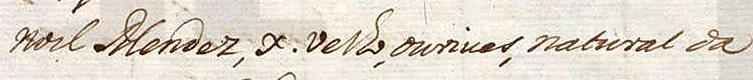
noel Mendez, x. velho, ouriues, natural da
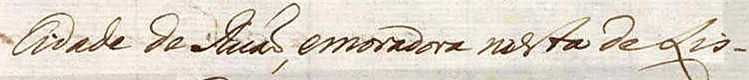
Cidade de Ruão, e moradora nesta de Lis
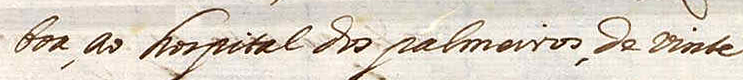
boa, ao hospital dos palmeiros, de vinte
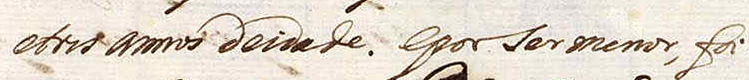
e tres annos de idade. e por ser menor, foi
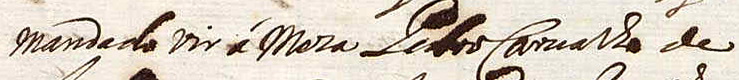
mandado vir á Meza Pedro Carualho de
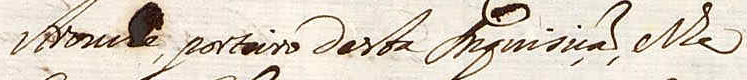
Arouc_e, porteiro desta Inquisição, e lhe
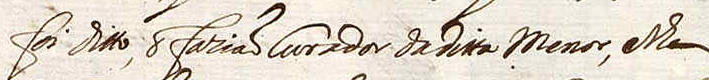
foi ditto, o fazião Curador da ditta Menor, e lhe
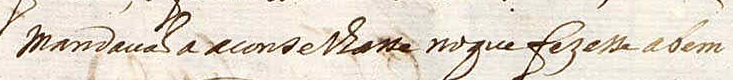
mandauão a aconselhasse no que fezesse a bem
